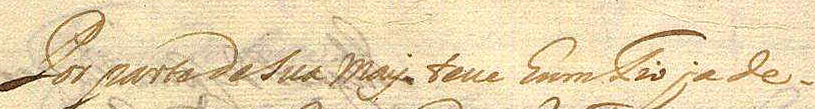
Por parte de sua may teue hum Tio ja de
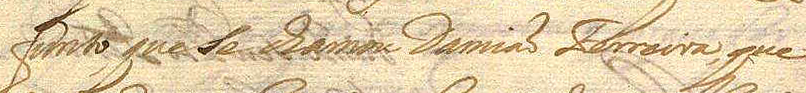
funto, que se chamou Damiaõ Ferreira, que
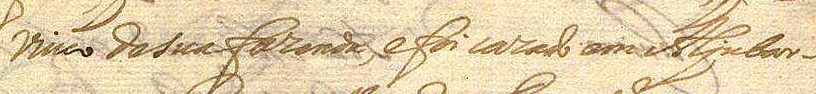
viueo da sua fazenda, e foi cazado em Aljubar
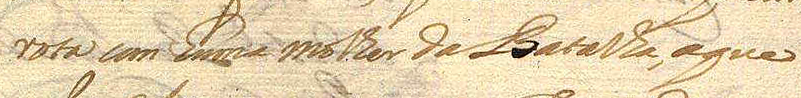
rota com huma molher da Batalha, a que
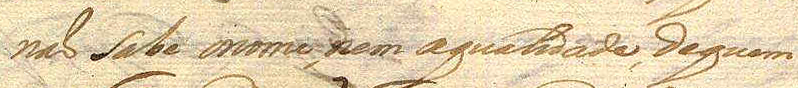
naõ sabe o nome, nem a qualidade, de quem
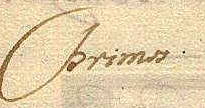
primos
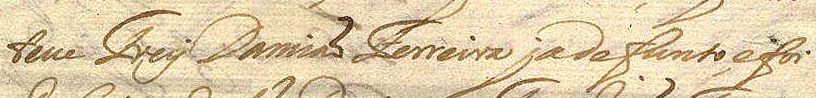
teue Frey Damiaõ Ferreira ja defunto, e foi
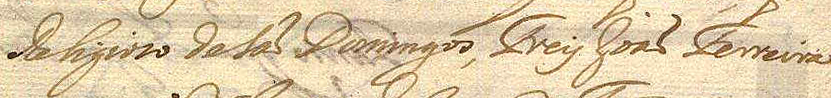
Religiozo de Saõ Domingos, Frey Joaõ Ferreira
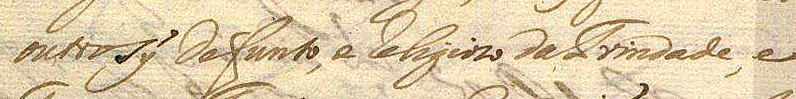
outrosy Defunto, e Religiozo da Trindade, e
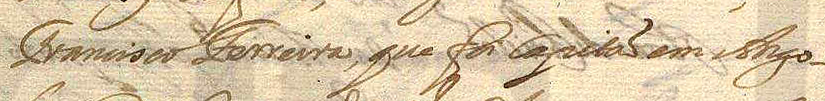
Francisco Ferreira, que foi Capitaõ em Ango
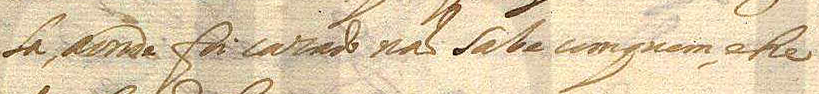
la, aonde foi cazado naõ sabe com quem, e he
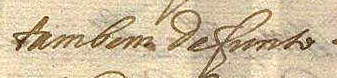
tambem defunto
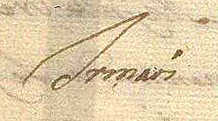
Irmaõs
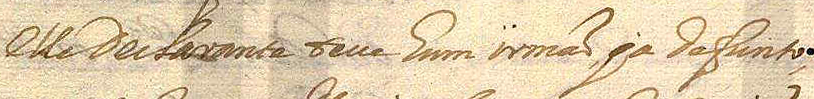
Elle Declarante teue hum irmaõ, ja defunto,
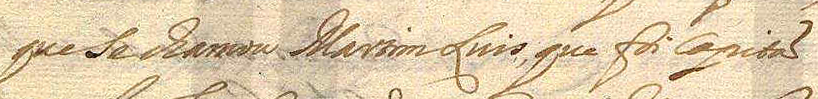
que se chamou Martim Luis, que foi capitaõ
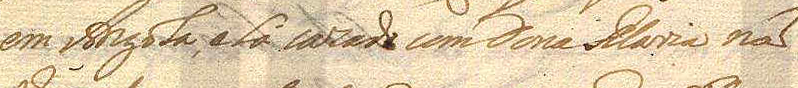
em Angola, e lá cazado com Dona Maria naõ
